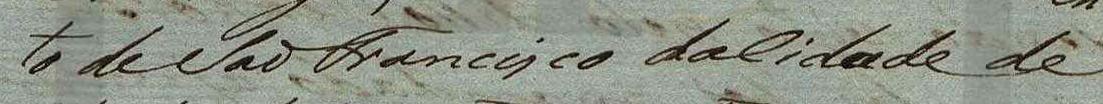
to de Saõ Francisco da Cidade de
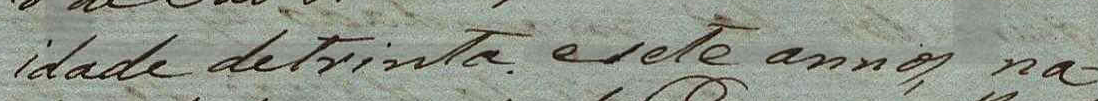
idade de trinta e sete annos, na
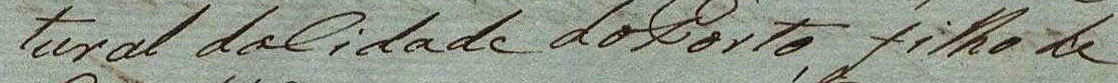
tural da Cidade do Porto, filho de
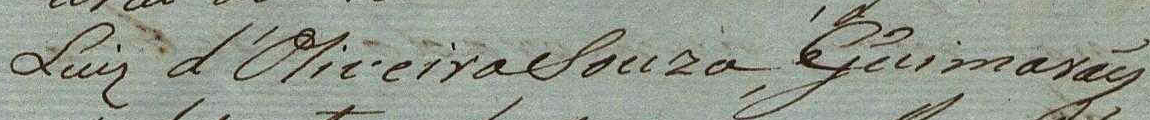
Luis d'Oliveira Souza, Guimaraẽs
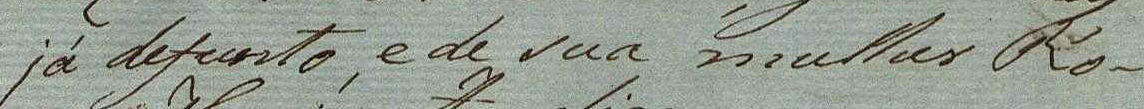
já defunto, e de sua mulher Ro
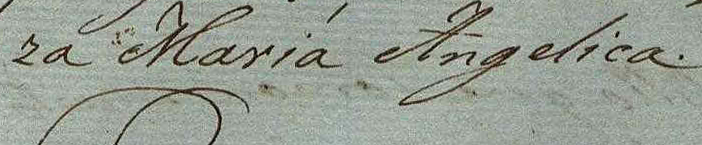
za Maria Angelica.
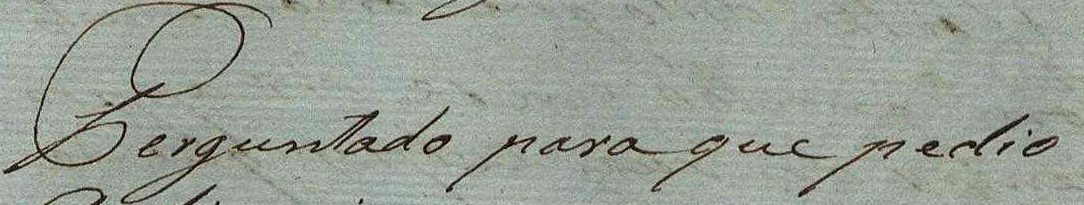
Perguntado para que pedio
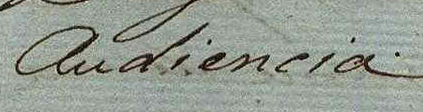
Audiencia.
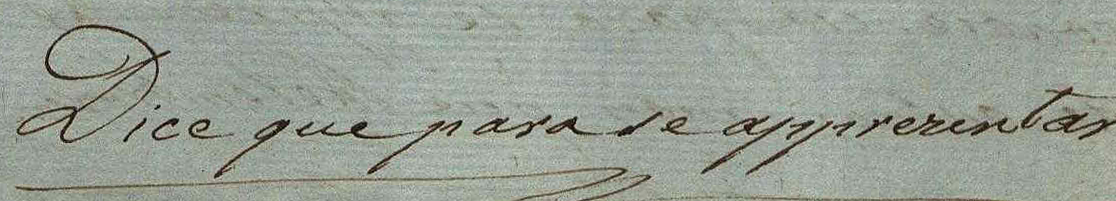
Dice que para se apprezentar
